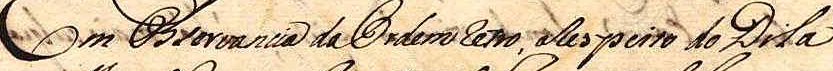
Em Observancia da Ordem Retro, a respeito do Dila
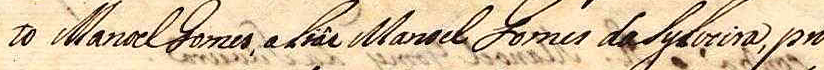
to Manoel Gomes, aliás Manoel Gomes da Sylveira, pro
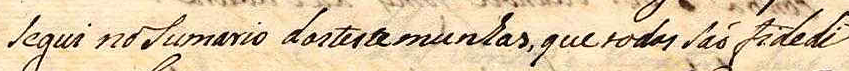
segui no Sumario das testemunhas, que todas são fidedi
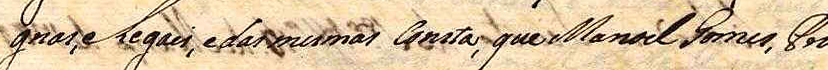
gnas, e legais, e das mesmas consta, que Manoel Gomes, Pro
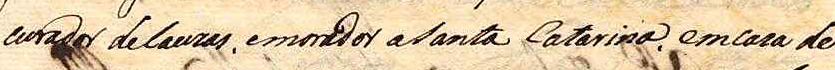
curador de cauzas, e morador a santa Catarina, em casa de
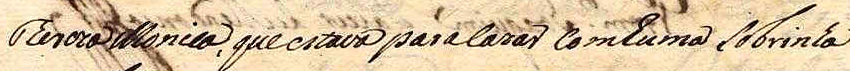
Thereza Monica, que estava para cazar com huma sobrinha
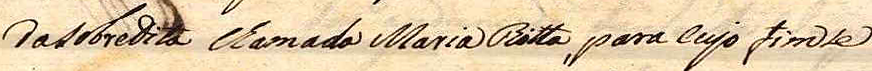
da sobredita chamada Maria Ritta, para cujo fim se
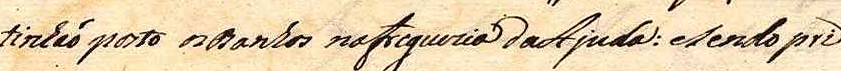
tinhaõ posto os banhos na freguezia da Ajuda: e sendo pri
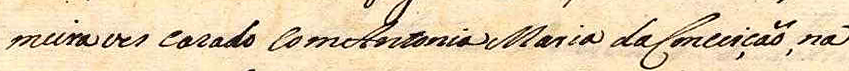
meira ves cazado com Antonia Maria da Conceiçaõ, na
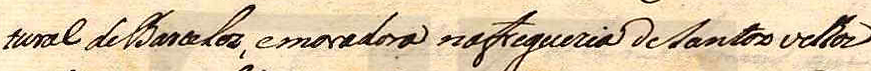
tural de Barceloz, e moradora na freguezia de santos velhoz
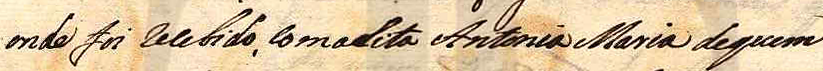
onde foi Recebido, com a dita Antonia Maria de quem
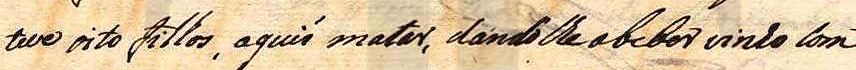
teve oito filhos, a quis matar, dandolhe a beber vinho com
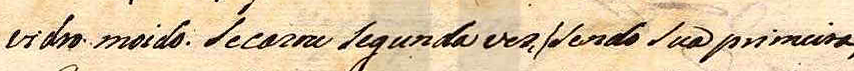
vidro moido. se cazou segunda ves, sendo sua primeira,
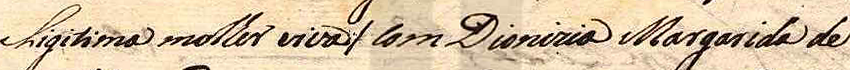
e ligitima molher viva com Dionizia Margarida de
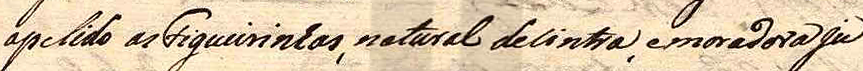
apelido as Figueirinhas, natural de Cintra, e moradora ju
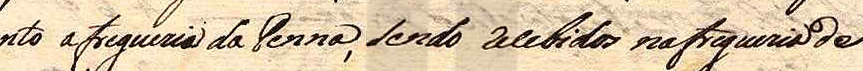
nto a freguezia da Penna, sendo recebidos na freguezia de
